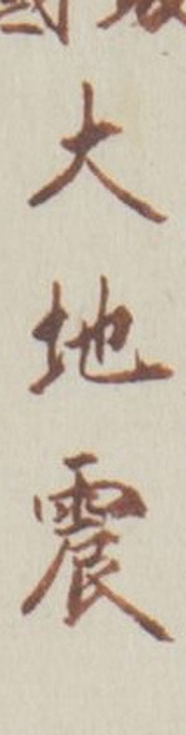大地震
